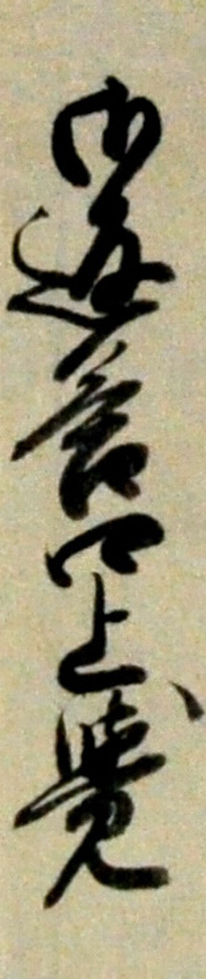御返答口上覚
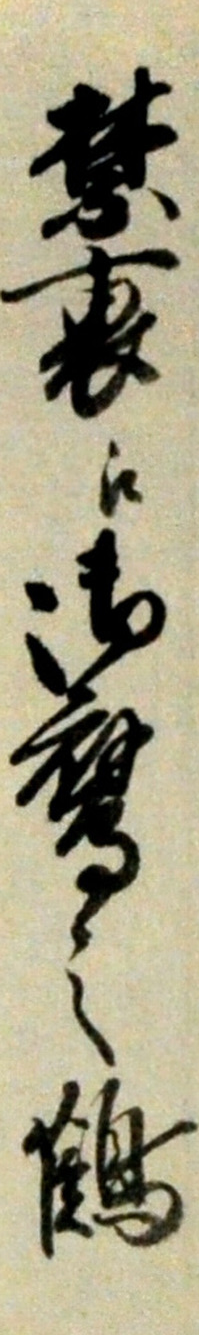禁裏え御鷹之鶴
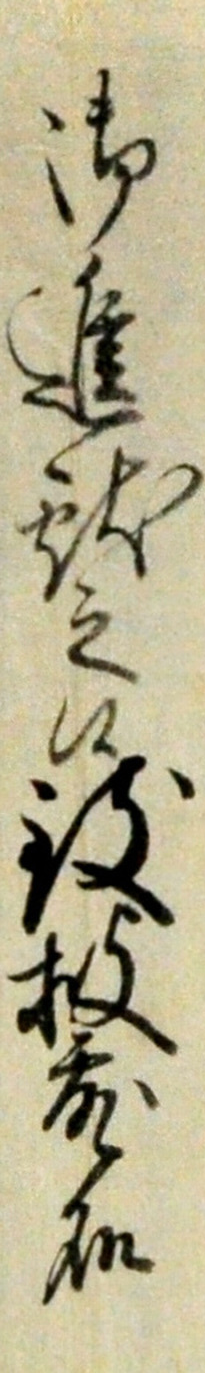御進献之候致披露候処
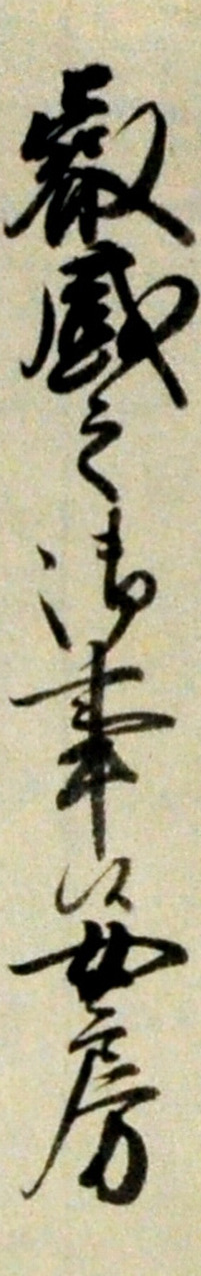叡感之御事候女房
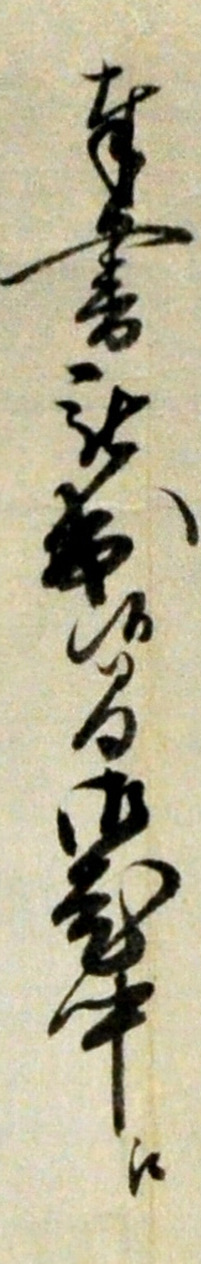奉書被出候間御老中え
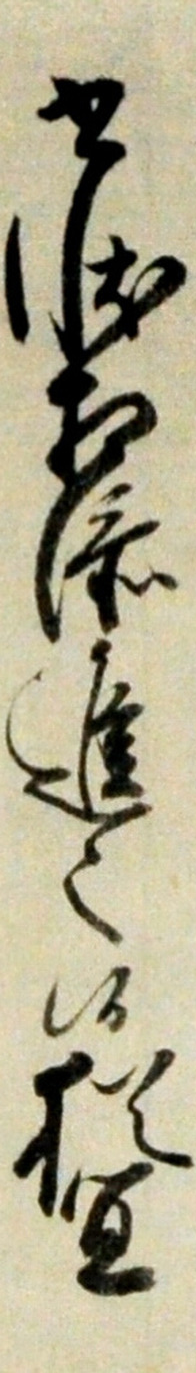書状相添進之候猶宜
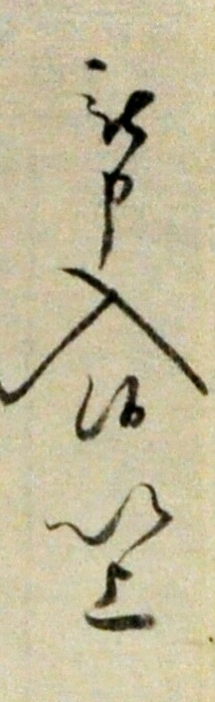被申入候以上
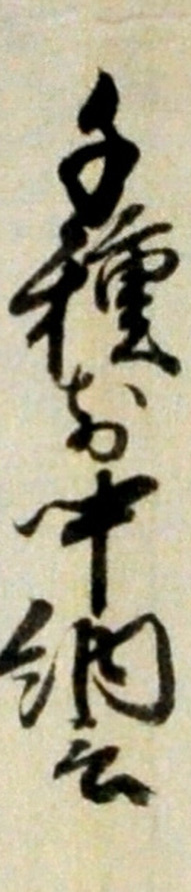千種前中納言
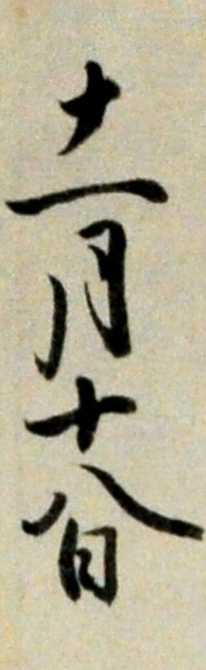十一月十八日
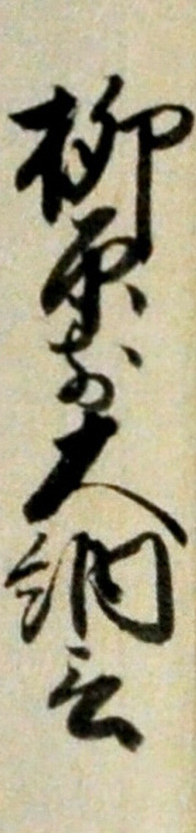柳原前大納言
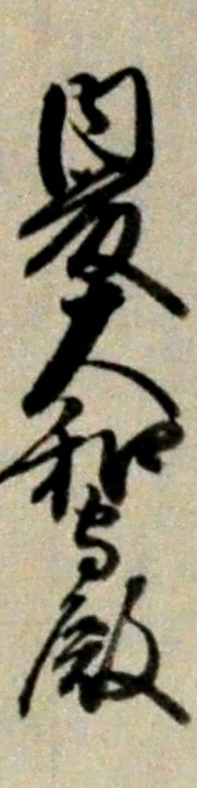内藤大和守殿
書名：御返答口上覚
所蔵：伊那市立高遠町図書館・合同会社AMANE
